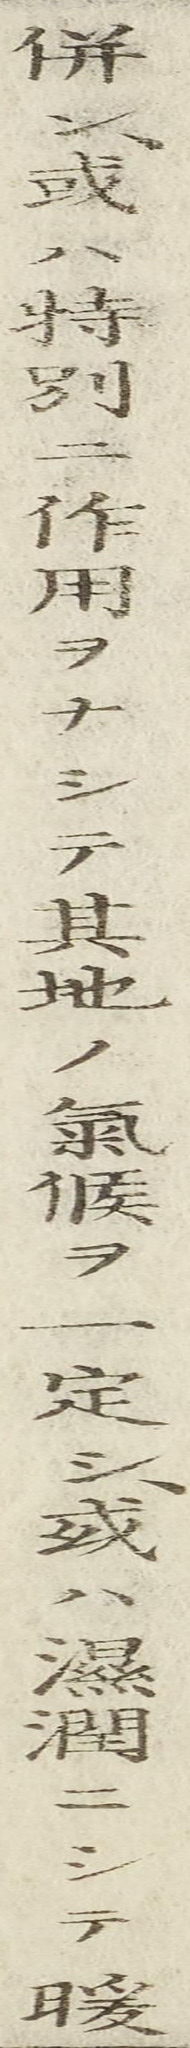併シ、或ハ特別ニ作用ヲナシテ其地ノ気候ヲ一定シ、或ハ湿潤ニシテ暖
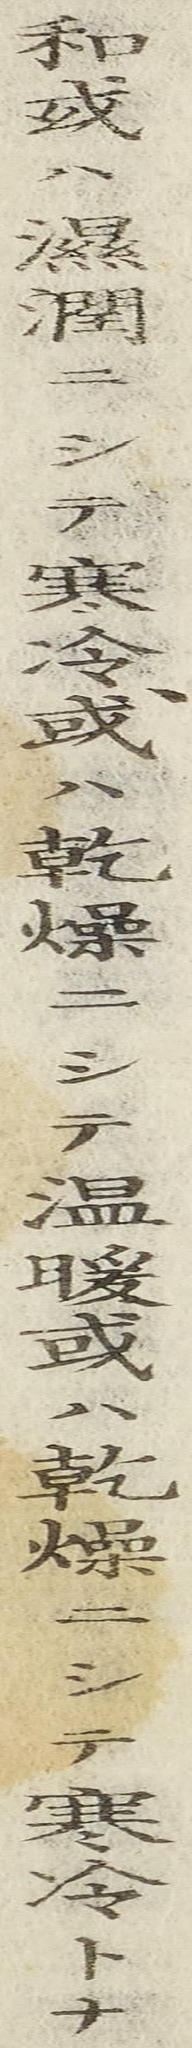和或ハ湿潤ニシテ寒冷、或ハ乾燥ニシテ温暖或ハ乾燥ニシテ寒冷トナ

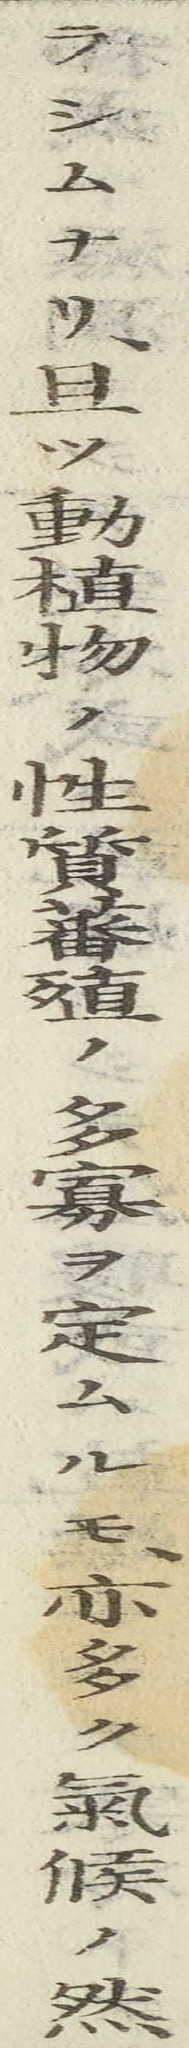ラシムナリ、且ツ動植物ノ性質蕃殖ノ多寡ヲ定ムルモ、亦多ク気候ノ然
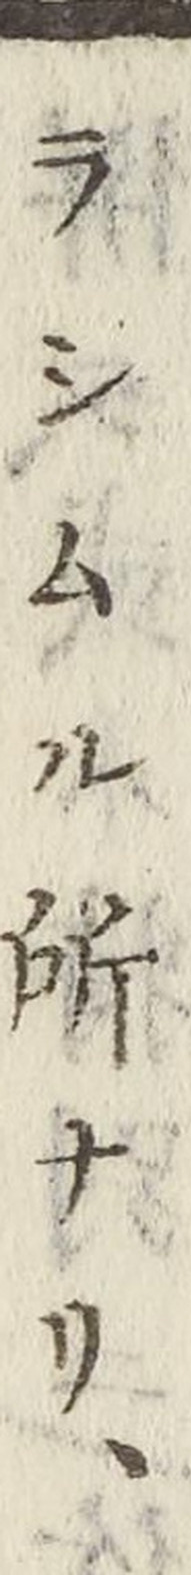ラシムル所ナリ、
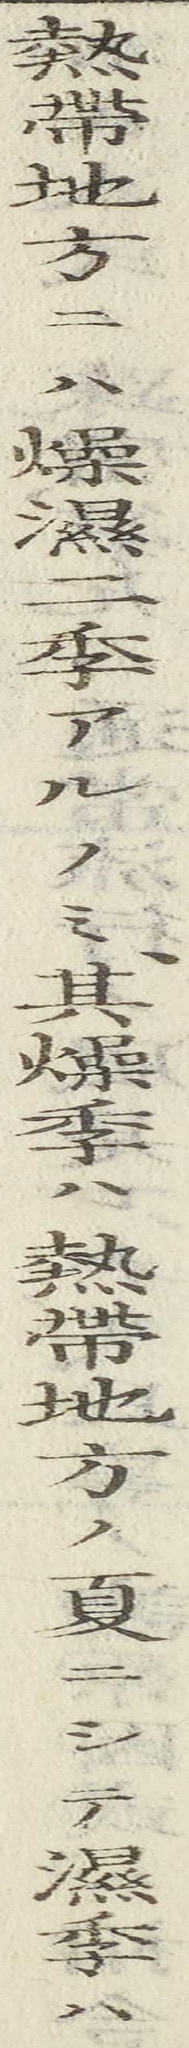熱帯地方ニハ燥湿二季アルノミ、其燥季ハ熱帯地方ノ夏ニシテ湿季ハ
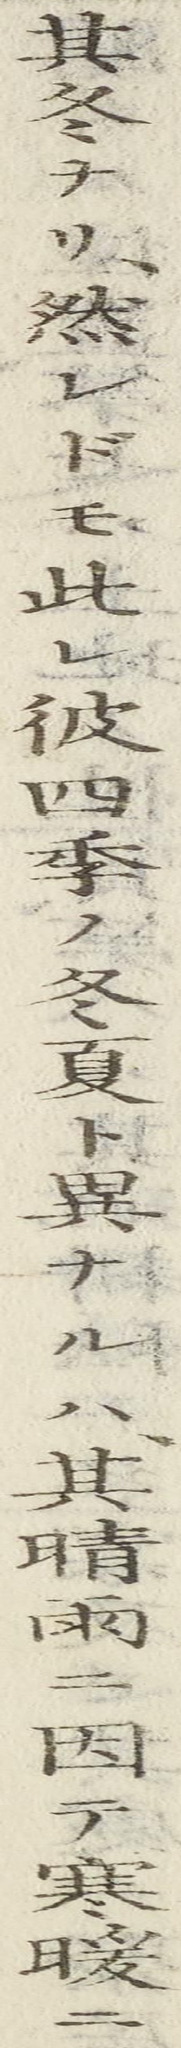其冬ナリ、然レドモ此レ彼四季ノ冬夏ト異ナルハ、其晴雨ニ因テ寒暖ニ
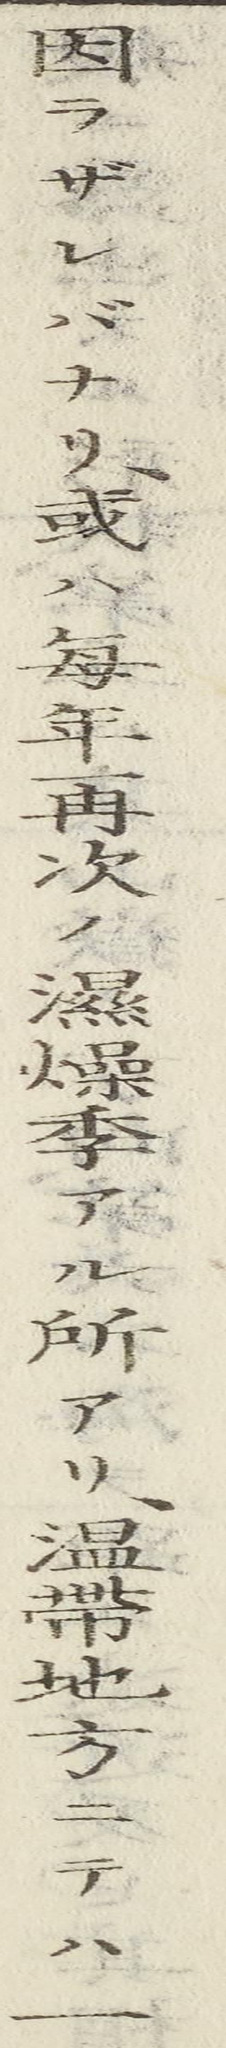因ラザレバナリ、或ハ毎年再次ノ湿燥季アル所アリ、温帯地方ニテハ一
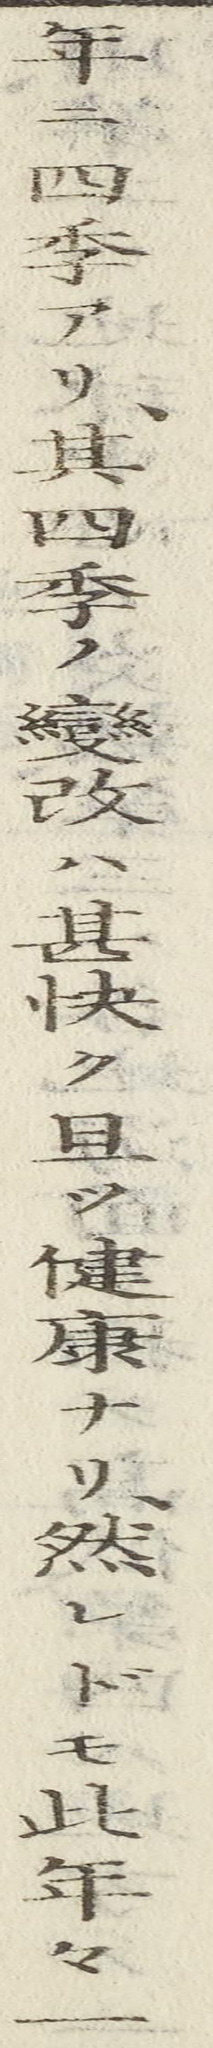年ニ四季アリ、其四季ノ変改ハ甚快ク且ツ健康ナリ、然レドモ此年々一
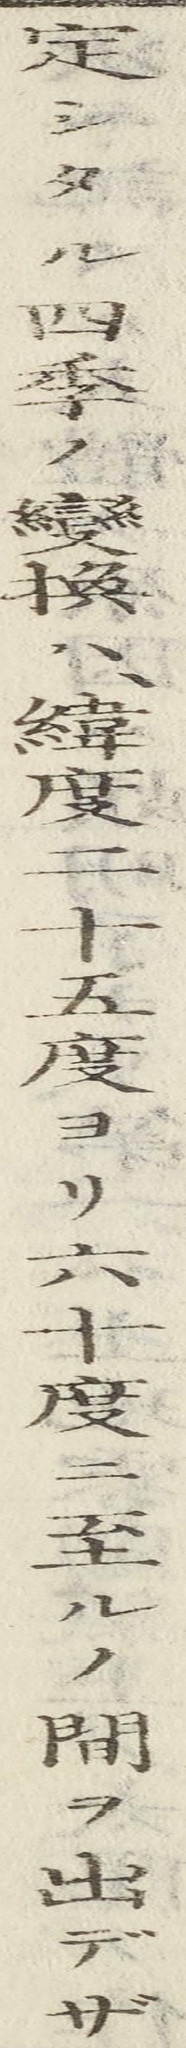定シタル四季ノ変換ハ、緯度二十五度ヨリ六十度ニ至ルノ間ヲ出デザ
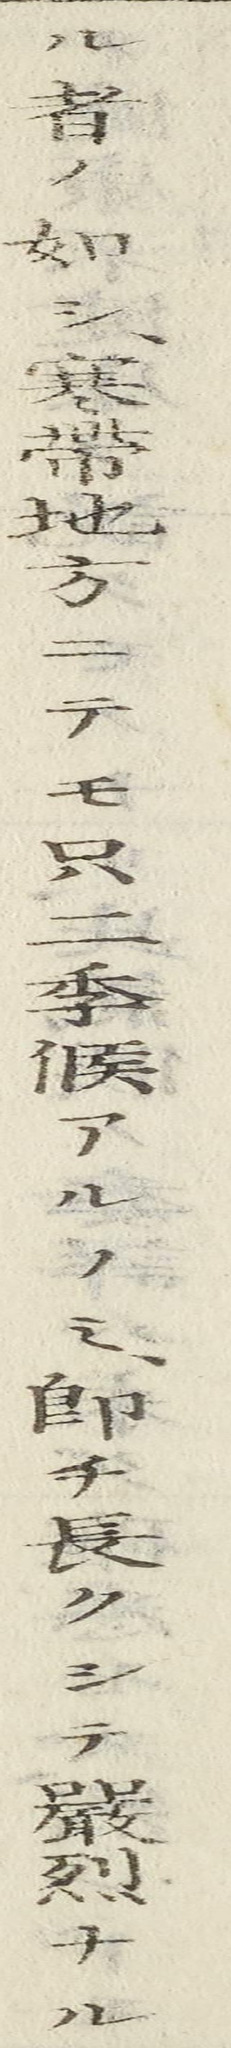ル者ノ如シ、寒帯地方ニテモ只二季候アルノミ、即チ長クシテ厳烈ナル
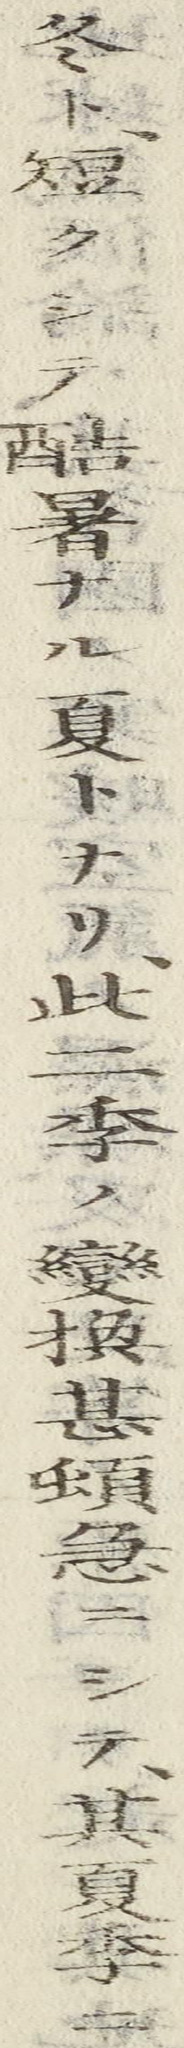冬ト、短クシテ酷暑ナル夏トナリ、此ニ季ノ変換甚頓急ニシテ、其夏季ニ
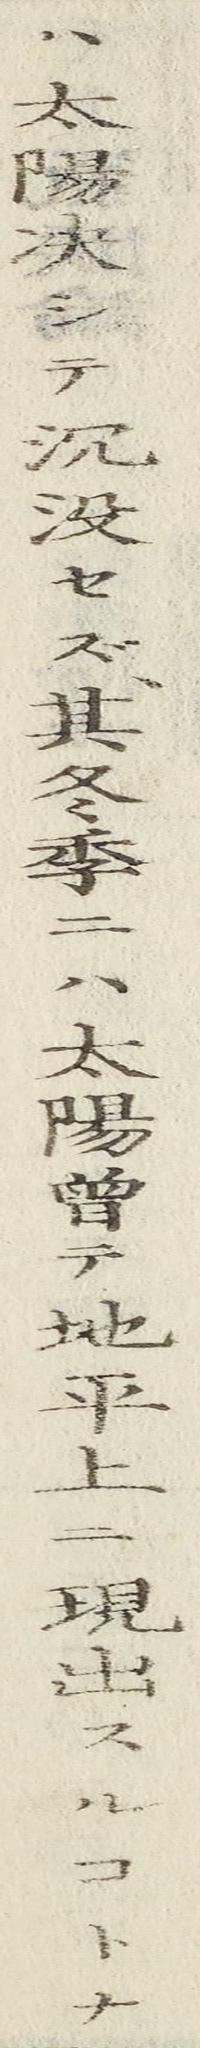ハ太陽決シテ沈没セズ、其冬季ニハ太陽嘗テ地平上ニ現出スルコトナ
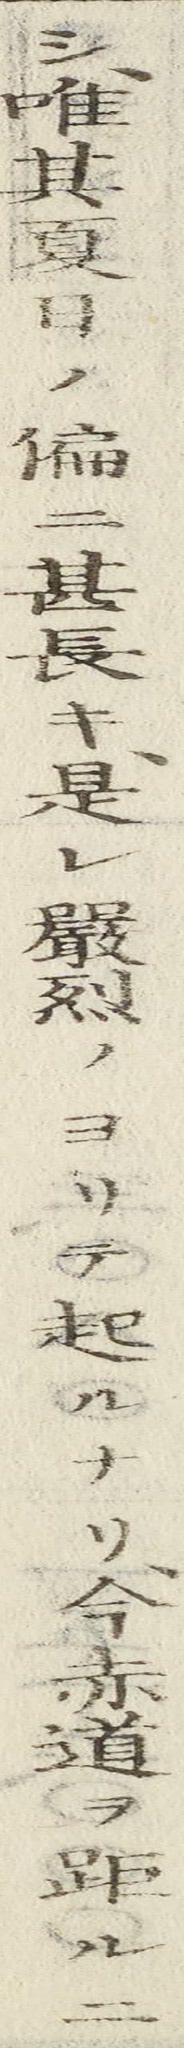シ、唯其夏日ノ偏ニ甚長キ、是レ厳烈ノヨリテ起ルナリ、今赤道ヲ距ルニ
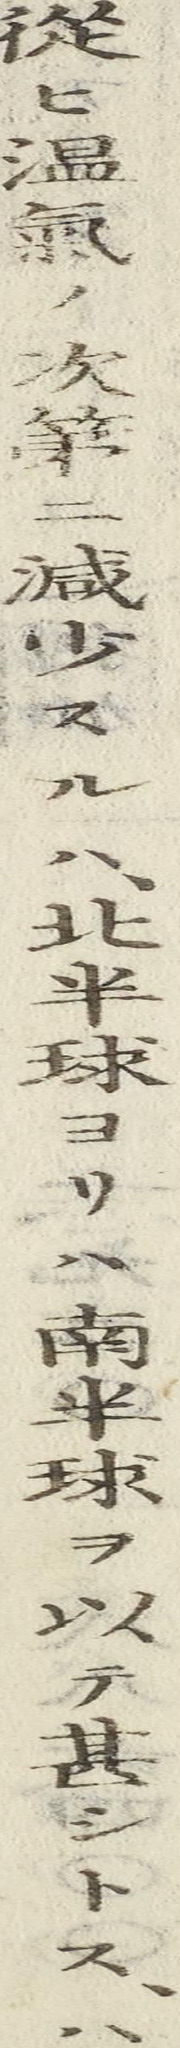従ヒ温気ノ次第ニ減少スルハ、北半球ヨリハ南半球ヲ以テ甚シトス、ハ
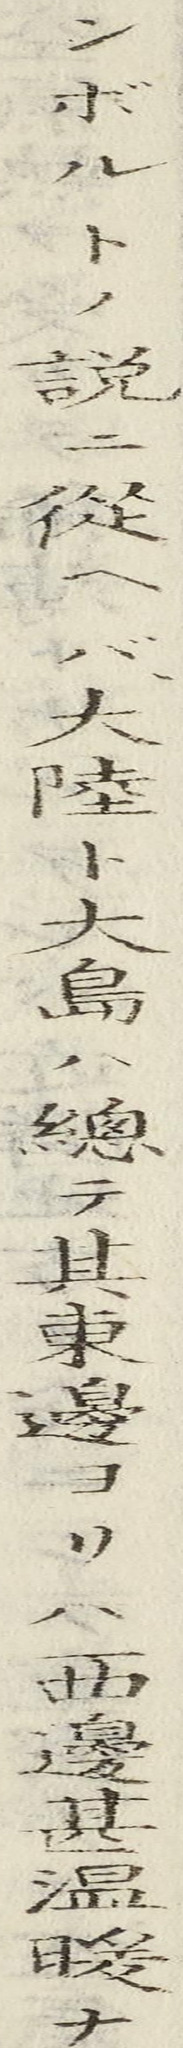ンボルトノ説ニ従ヘハ、大陸ト大島ハ総テ其東辺ヨリハ西辺甚温暖ナ
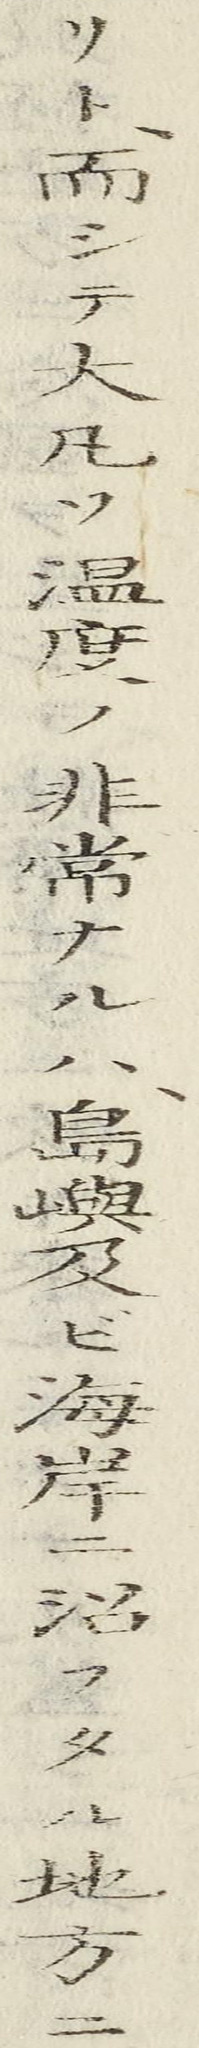リト、而シテ大凡ソ温度ノ非常ナルハ、島嶼及ビ海岸ニ沿フタル地方ニ
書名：百科全書　地文學　全
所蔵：東京大学地震研究所図書室 Earthquake Research Institute Library, The University of Tokyo, JAPAN
